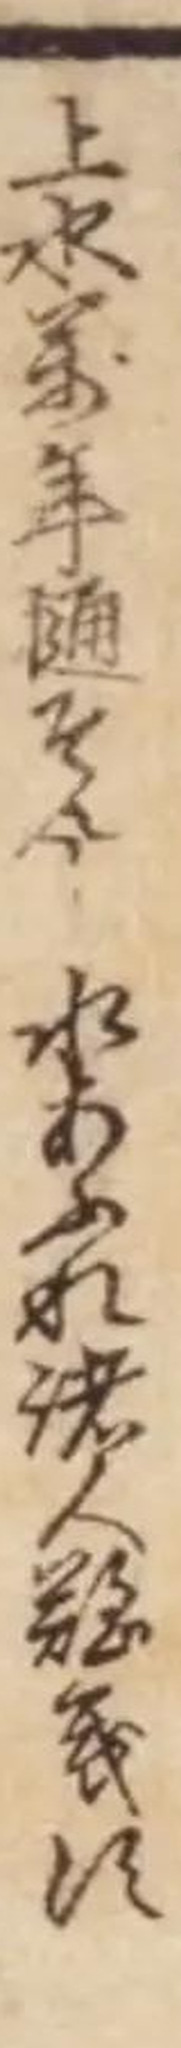上水万年樋そんじ水あふれ諸人難義す
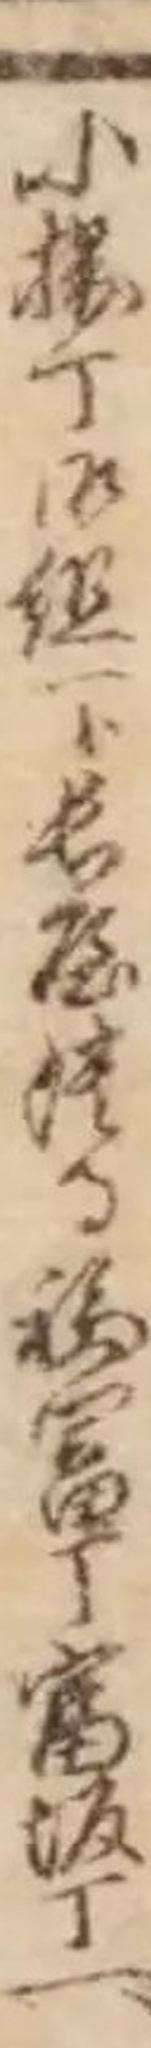小勝丁御組下長屋潰る福富丁富坂丁
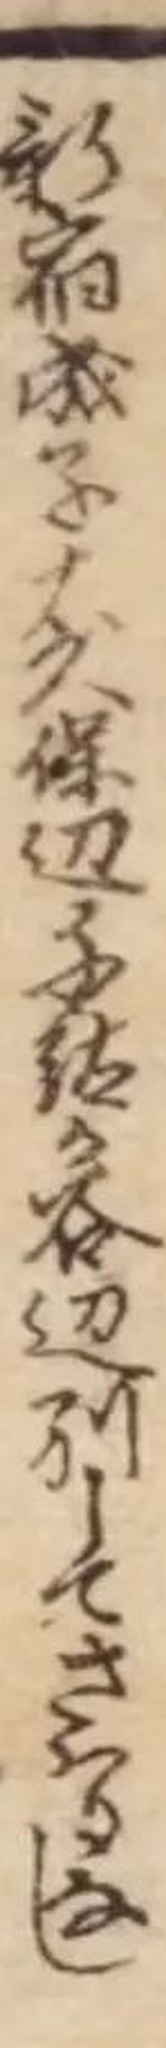新宿成子大久保辺千駄ヶ谷別してさわりなし
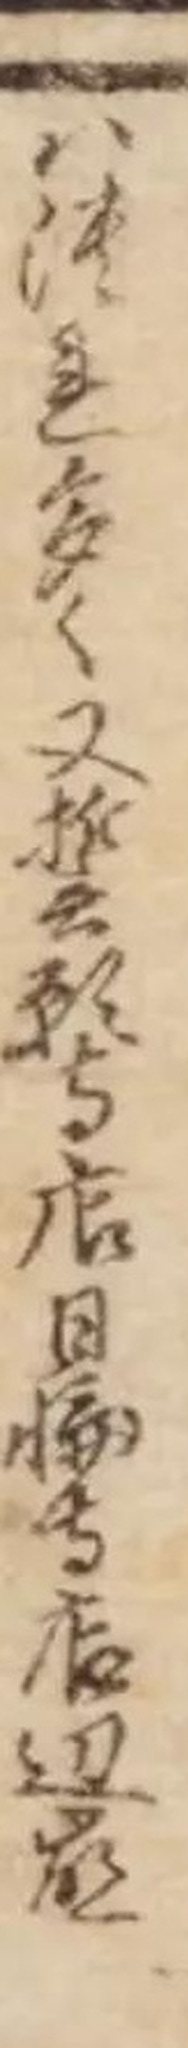は潰れ多く又誓願寺店日輪寺店辺崩
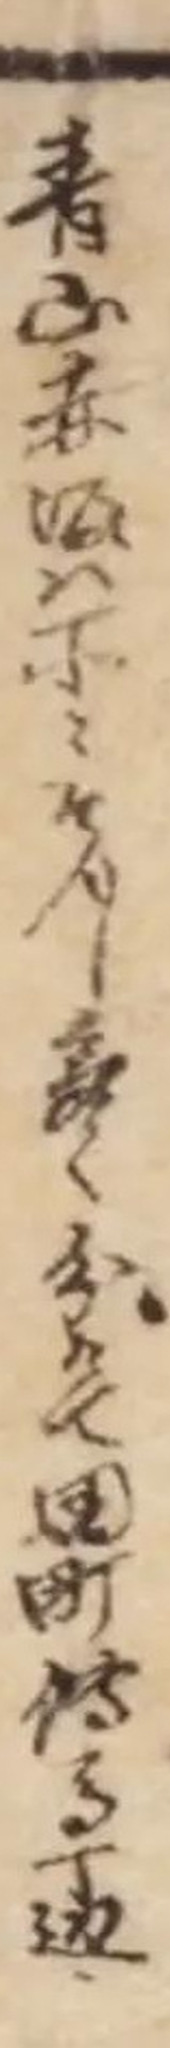青山赤坂は所〻そんじ多く分けて田町傳馬丁辺
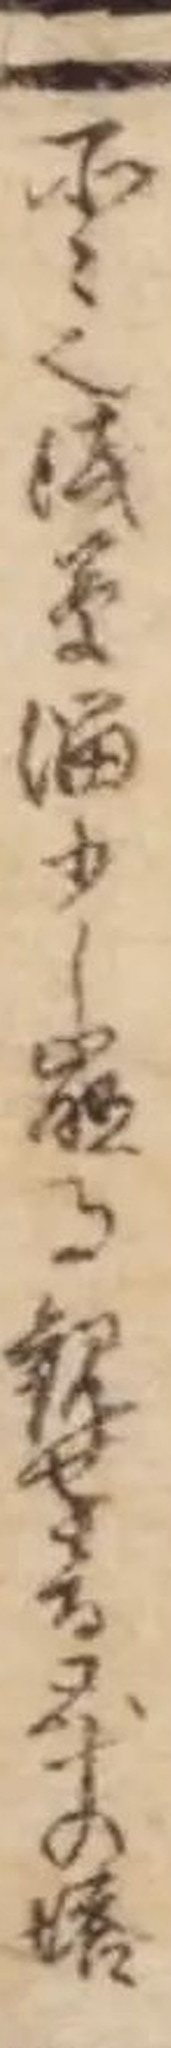所〻也浅草溜少し崩る観世音五十の塔
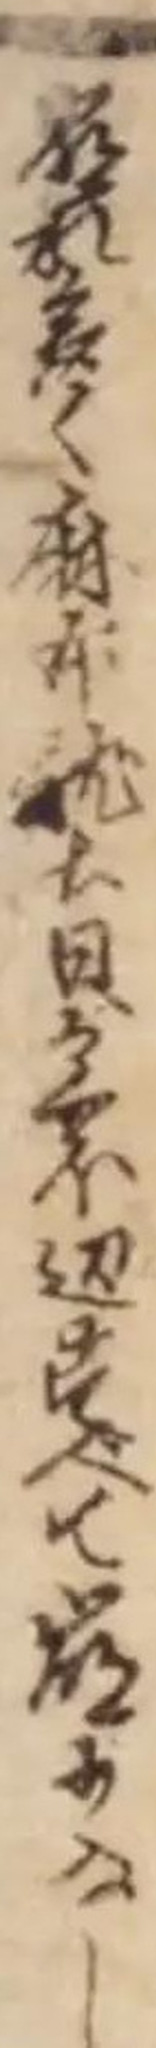崩れ多く麻布龍土日かくほ辺すべて崩少なし
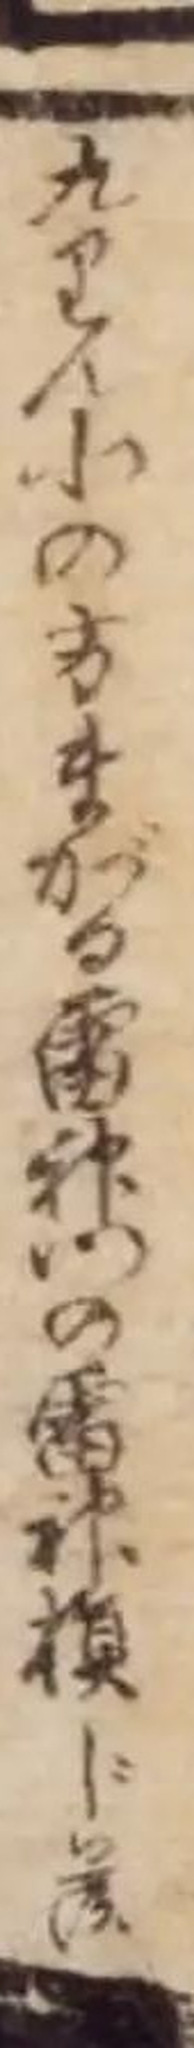九りん小の方まがる雷神門の雷神損じ落

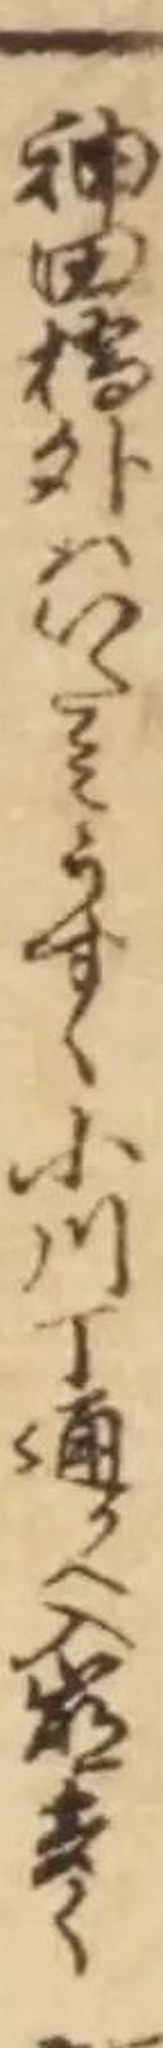神田橋外はいたみうすく小川丁通りへ入崩多く
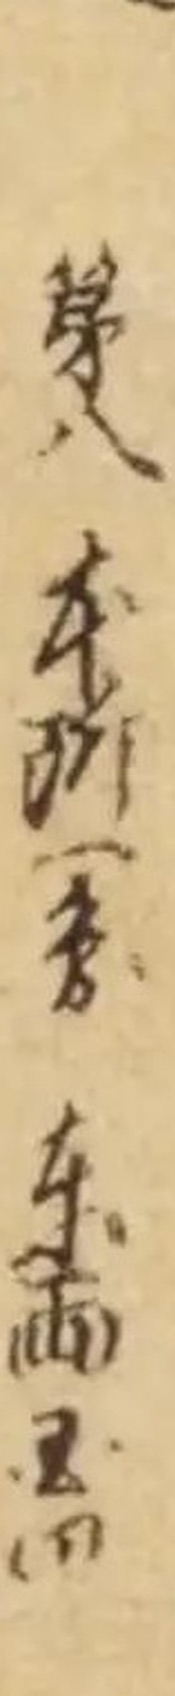第八本所一圓東両国辺
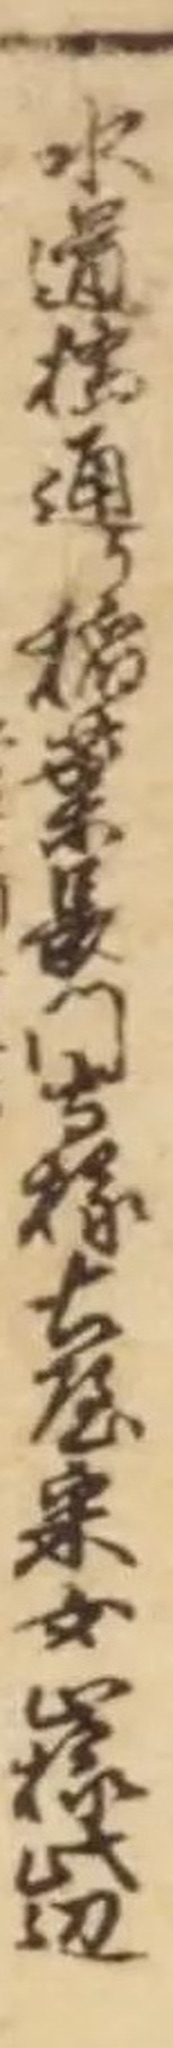水道橋通り稲葉長門守様土屋采女正様此辺
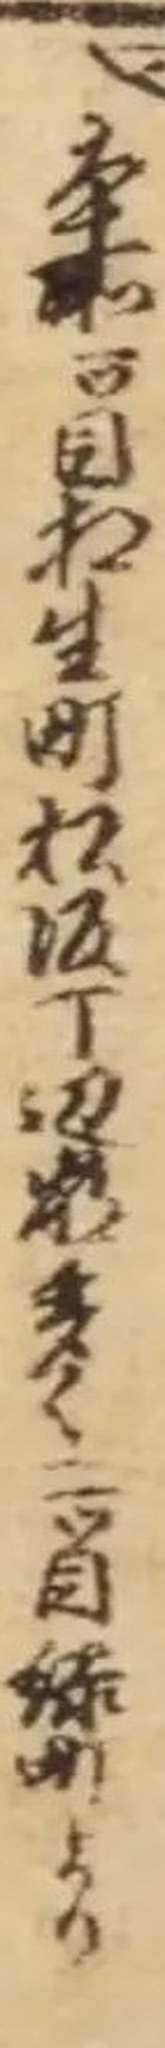本所一ツ目相生町松坂丁辺崩多く二ツ目緑町より
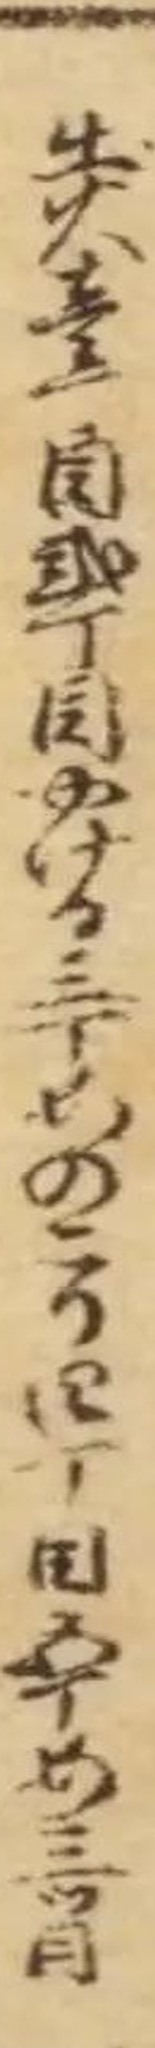出火壱丁目弐丁目やける三丁めのこり四丁目五丁め三ツ目
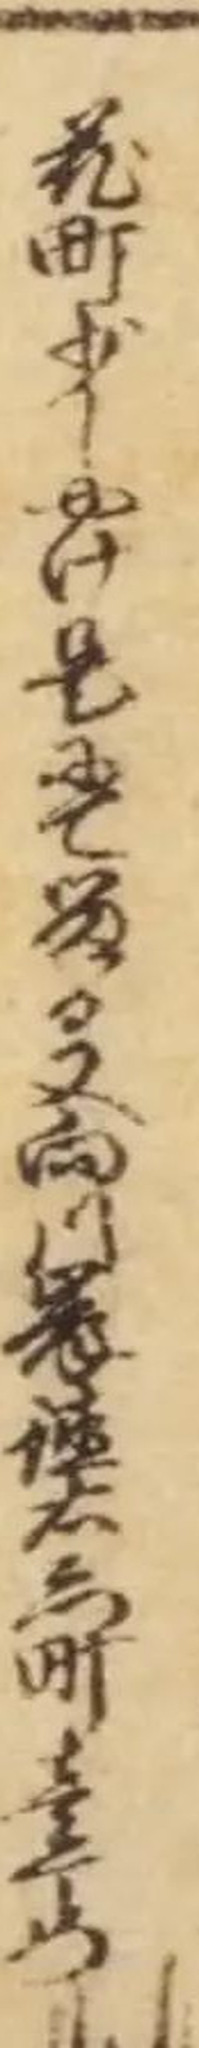花町少しやけ是にて留る又向川岸徳右衛門町壱丁め
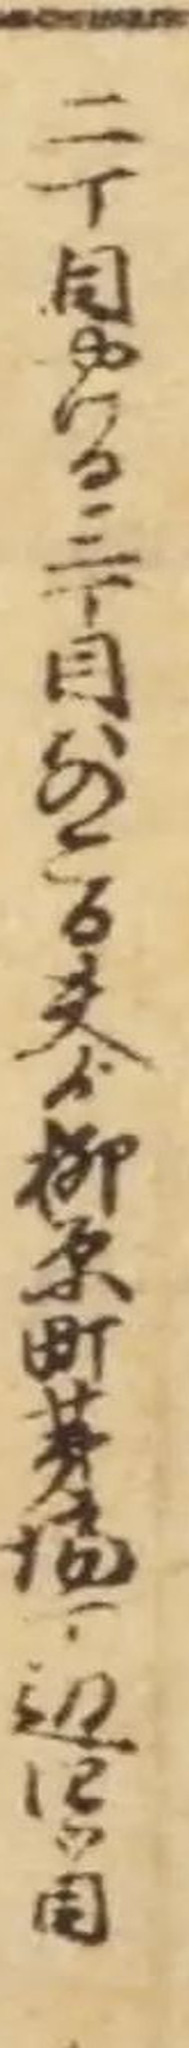二丁目やける三丁目はのこる夫より柳原茅場丁辺四ツ目
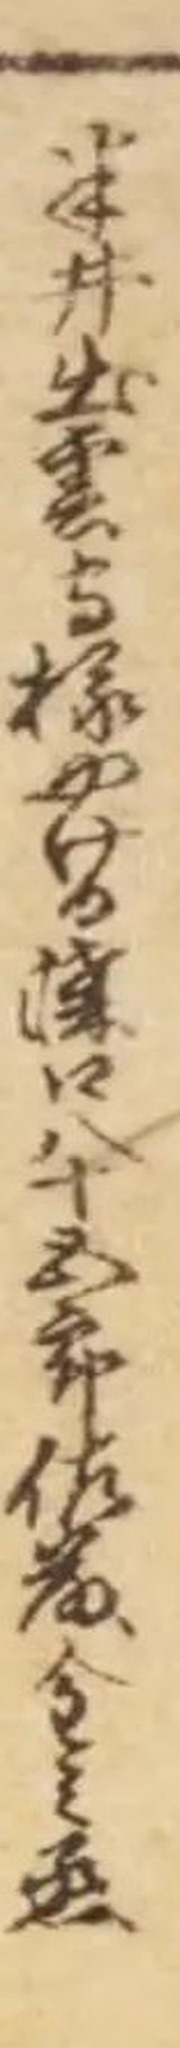半井出雲守様やける溝口八十五郎佐藤金之丞
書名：御江戸関八州大地震出火巨細記
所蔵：国立国会図書館 National Diet Library, JAPAN
